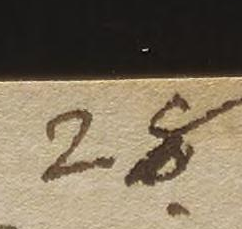28
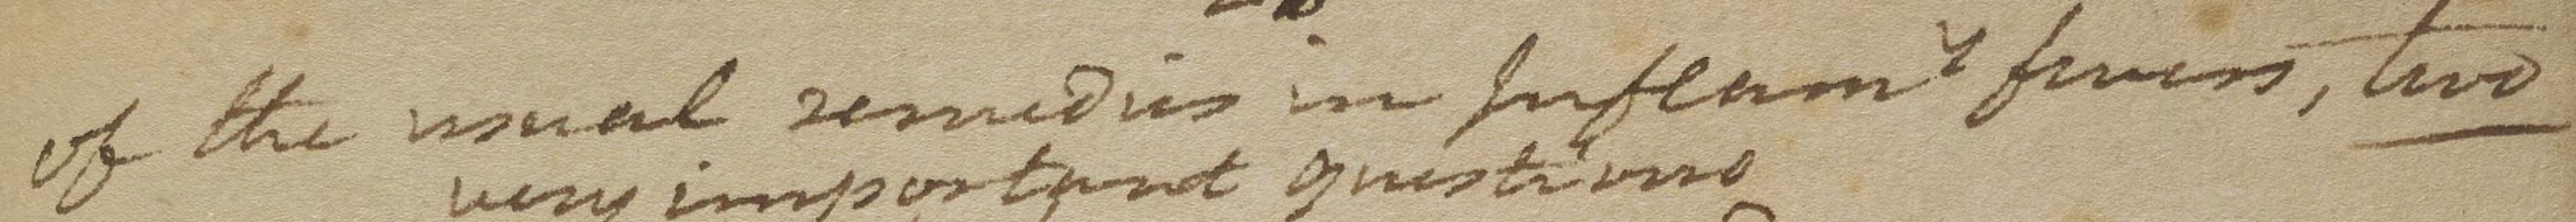of the usual remedies in Inflam^y fevers, two
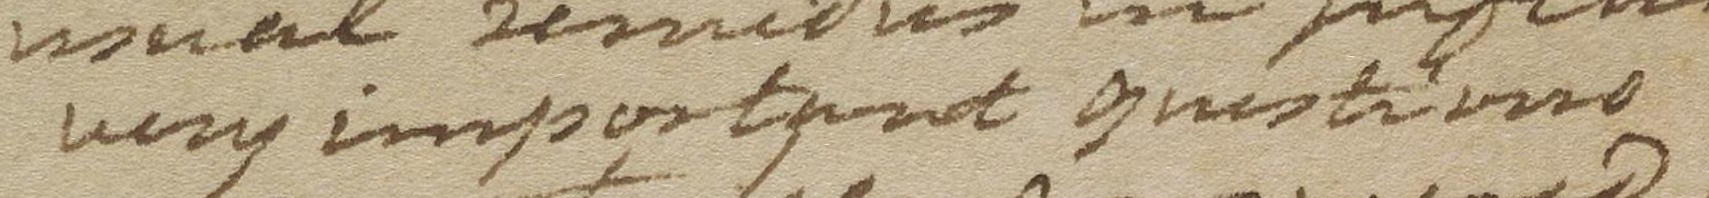very important questions
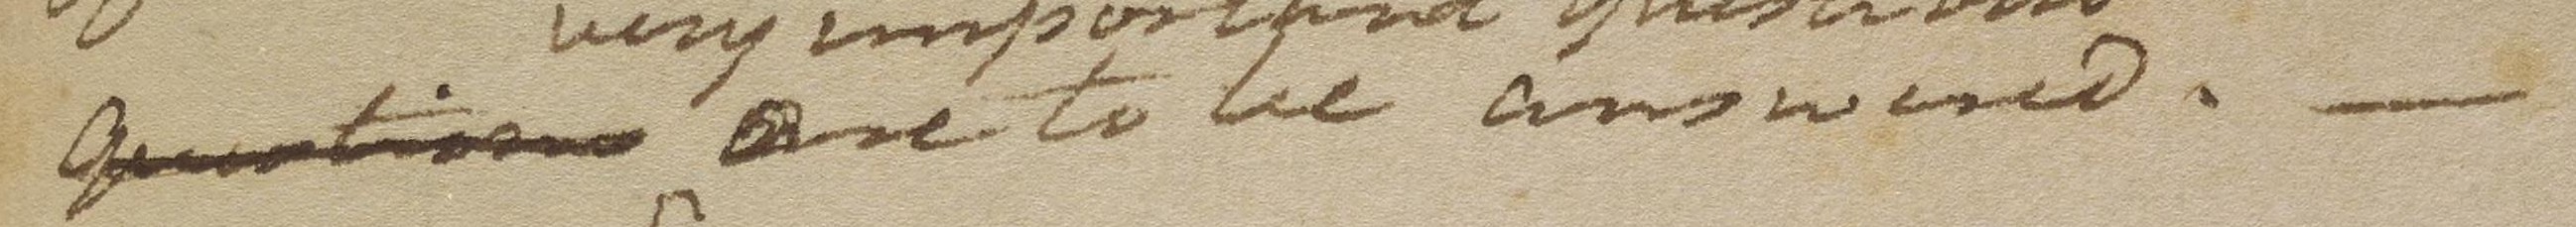[questions] ^ are to be answered.
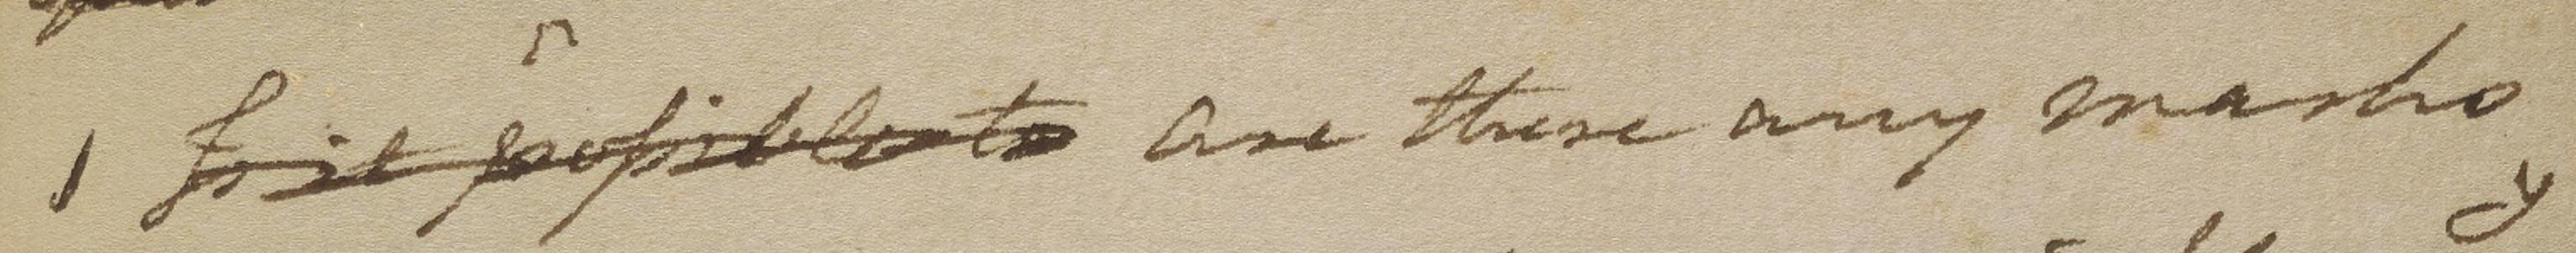1 [Is it possible to] Are there any marks
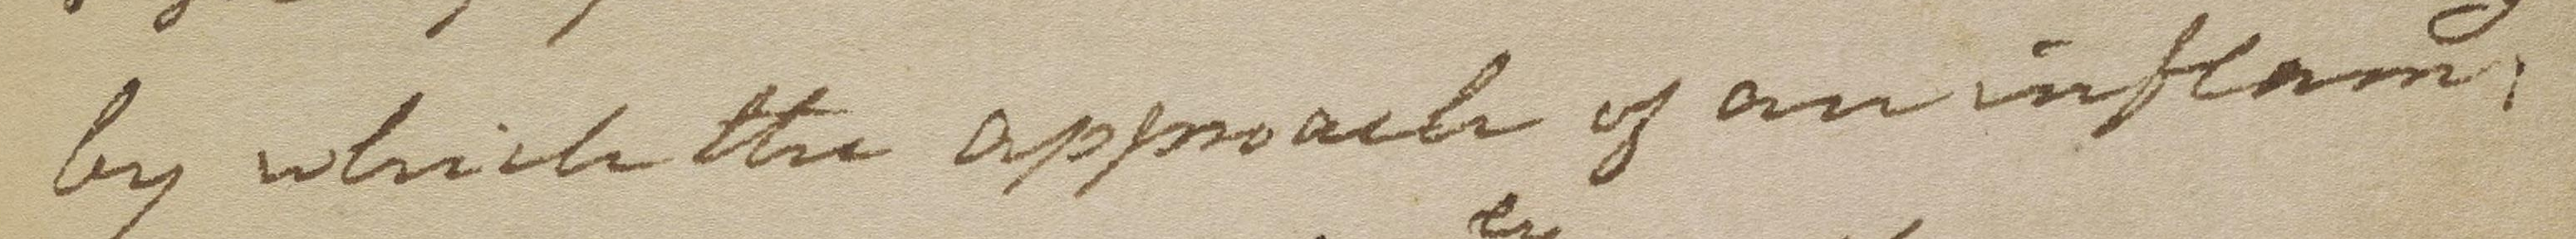by which the approach of an inflam^y
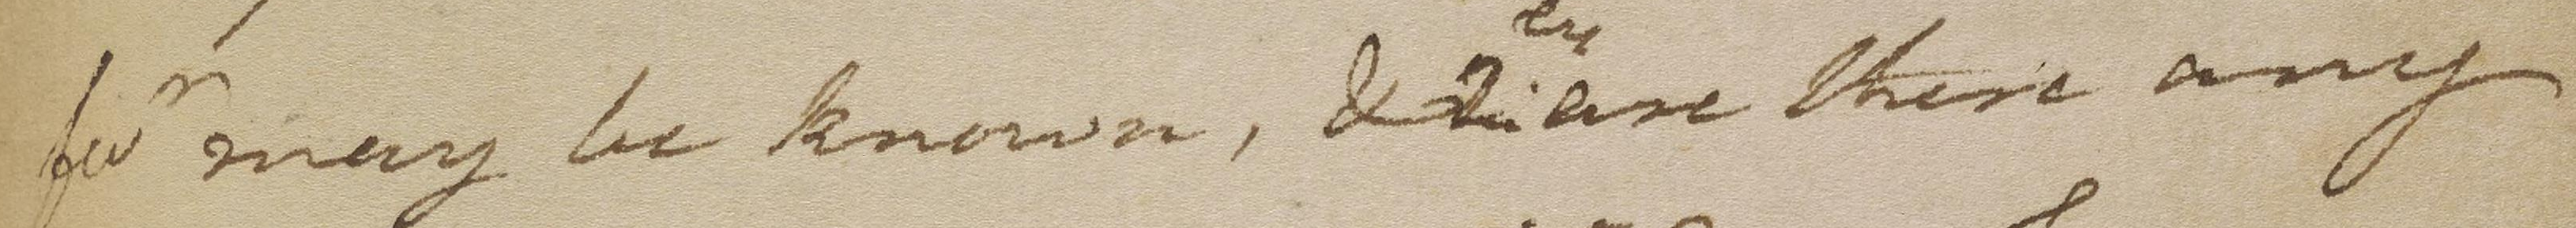fev^r may be known, & 2^ly Are there any
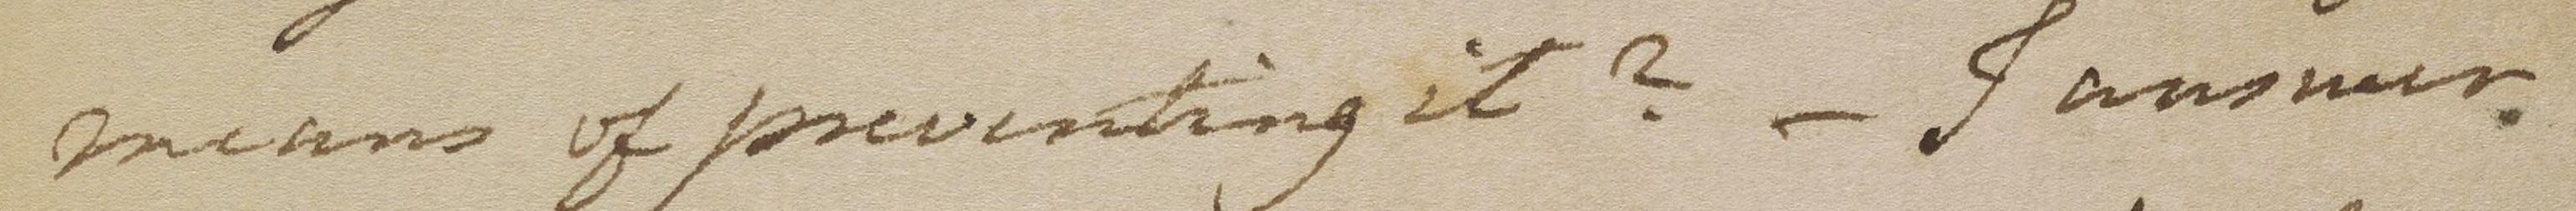means of preventing it? I answer
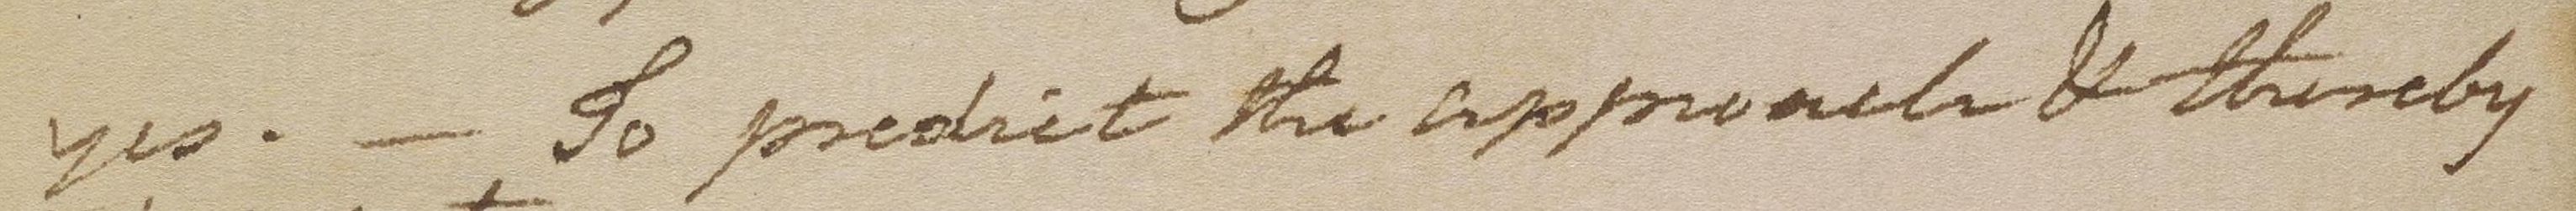yes.- To predict the approach & thereby
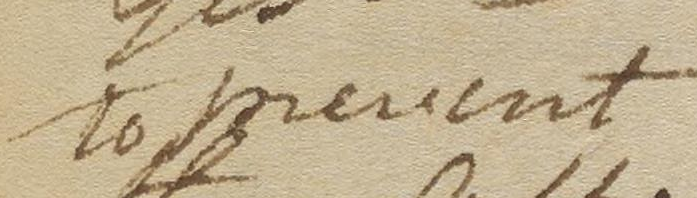to prevent
